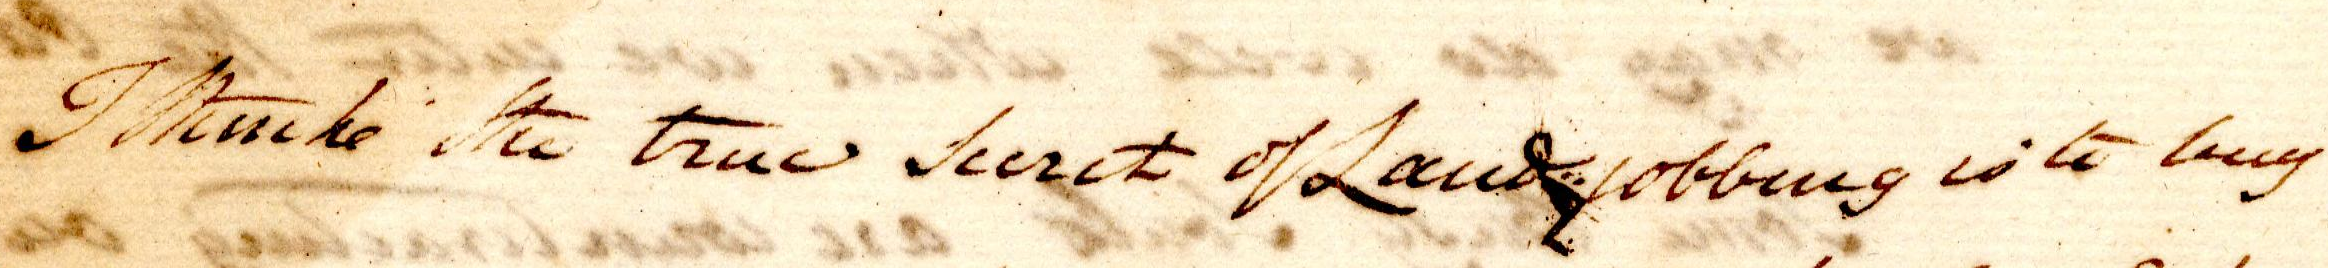I think the true secret of Land robbing is to buy
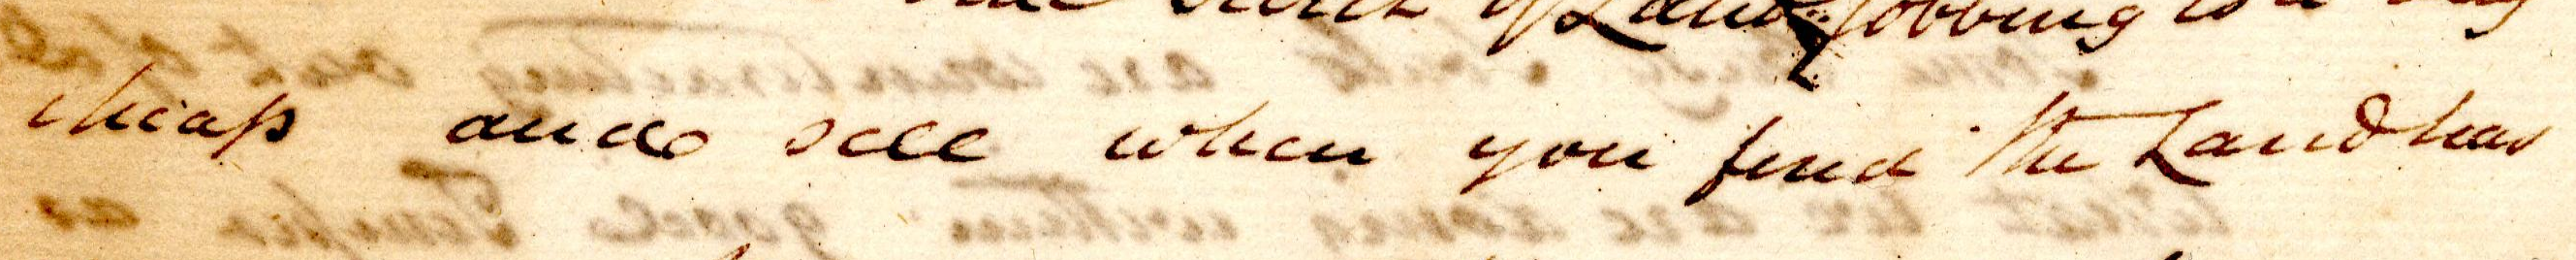cheap and sell when you find the Land has
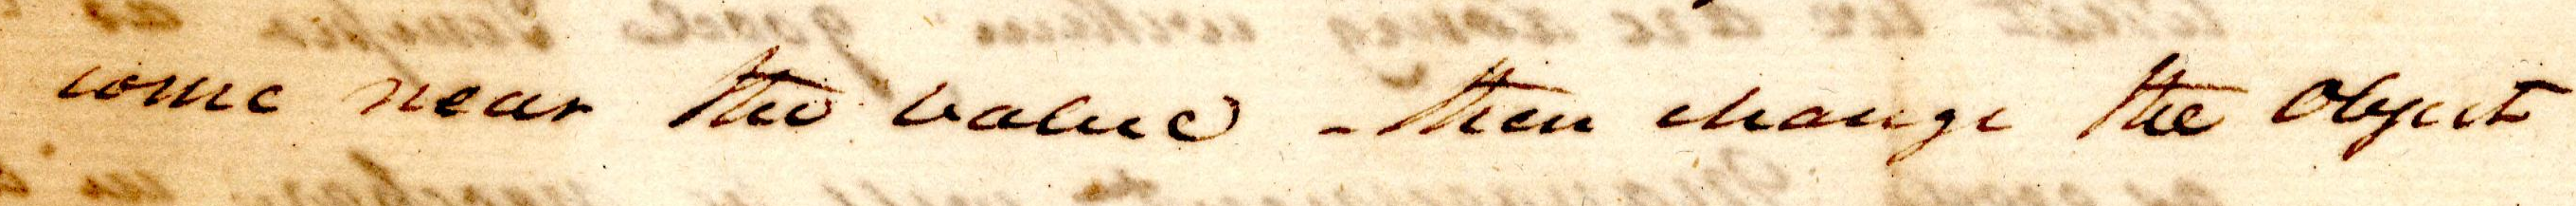come near the value- then change the Object
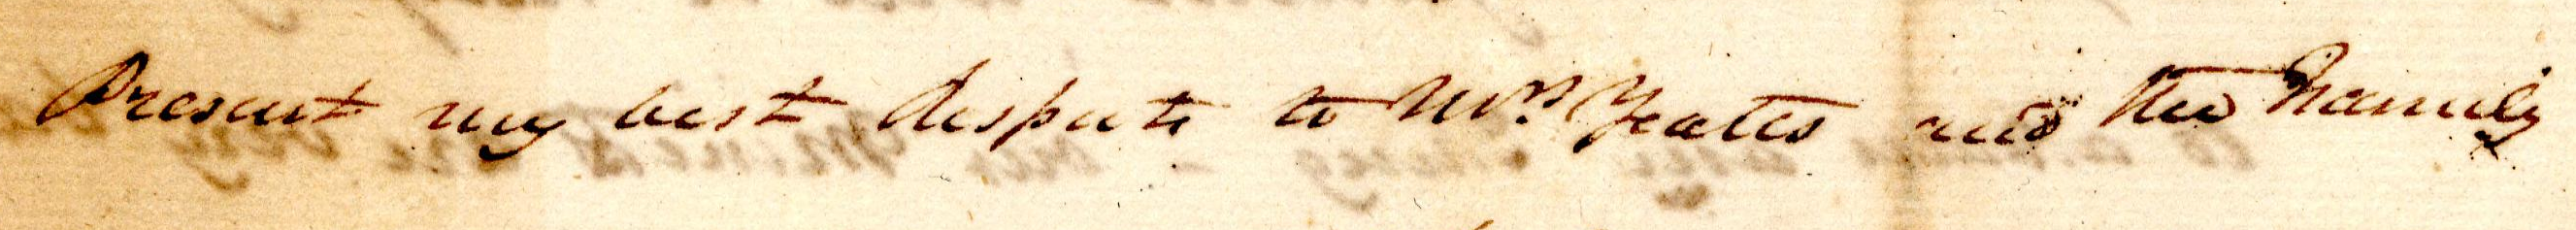Present my best Respects to M^rs Yeates and the Family
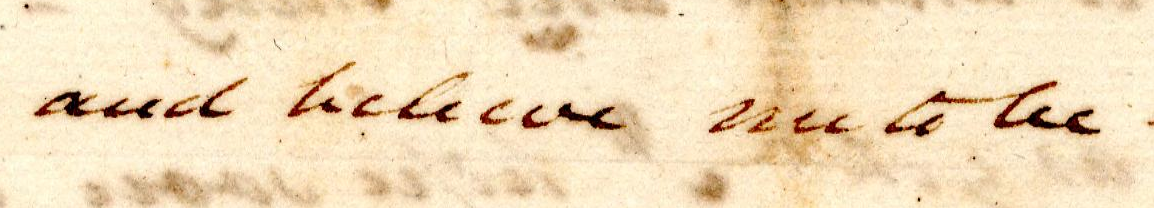and believe me to be
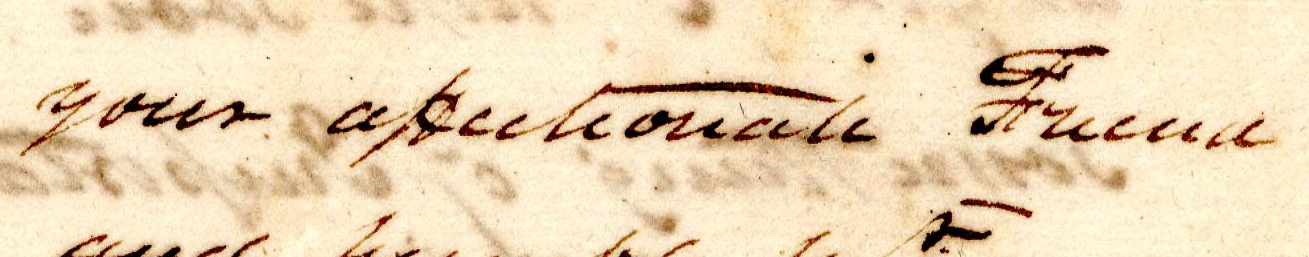your affectionate Friend
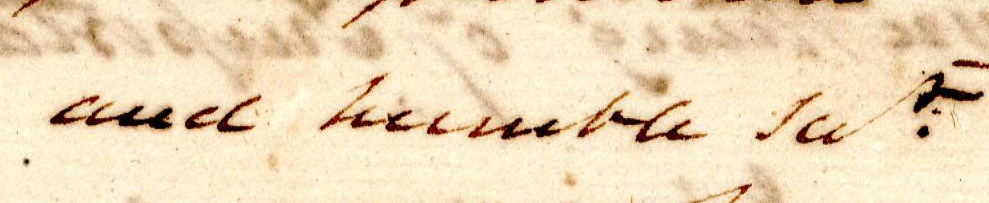and humble serv^t.
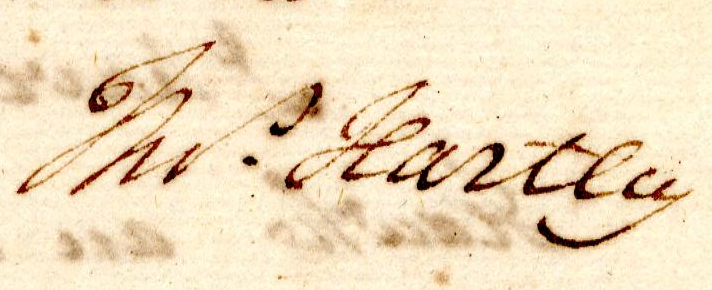Tho^s. Hartley
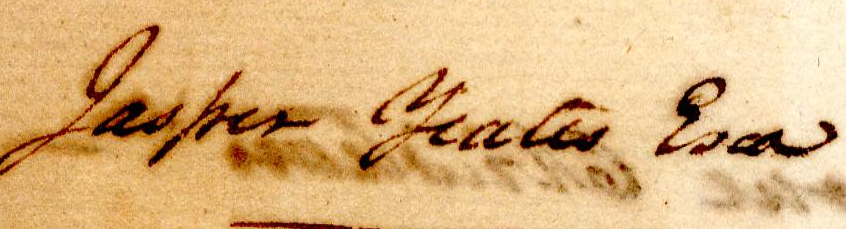Jasper Yeates Esq
